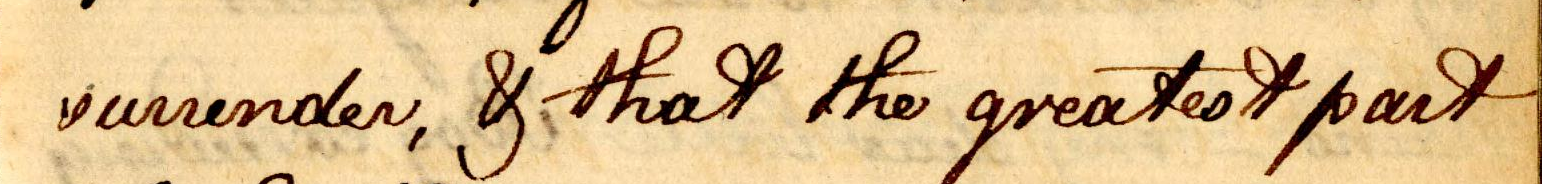surrender, & that the greatest part
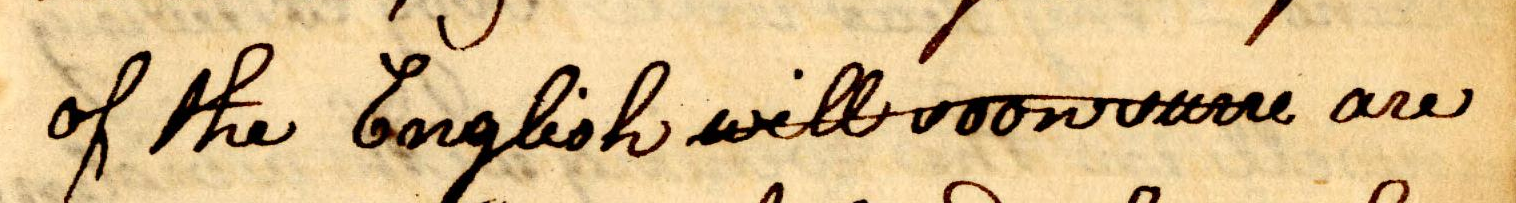of the English [will soon surre] are
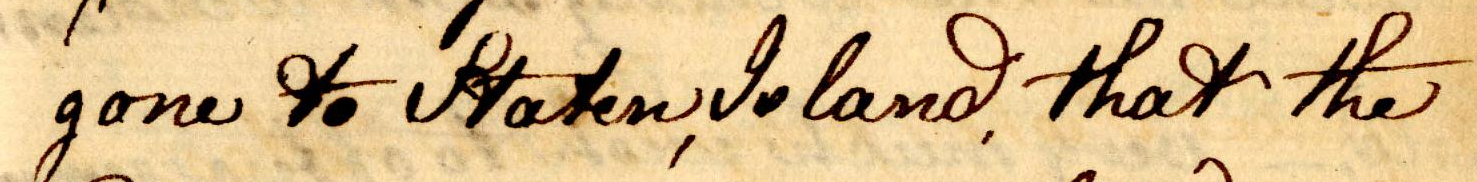gone to Staten Island, that the
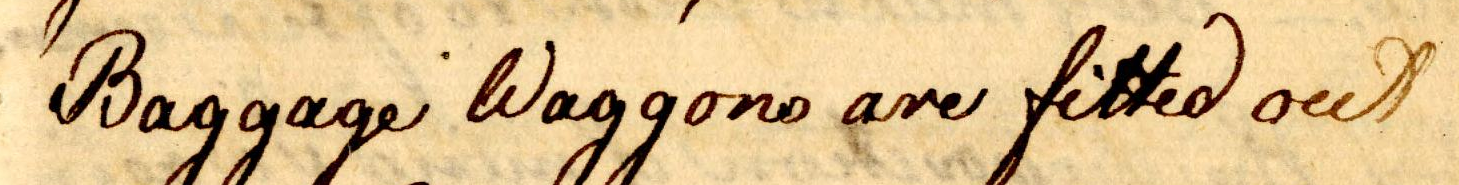Baggage Waggon are fitted out
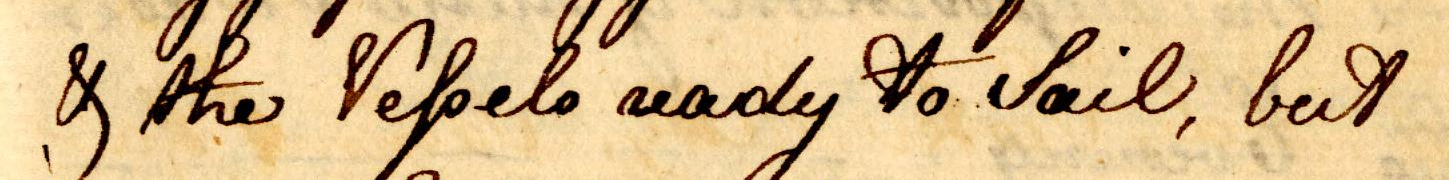& the Vessels ready to Sail, but
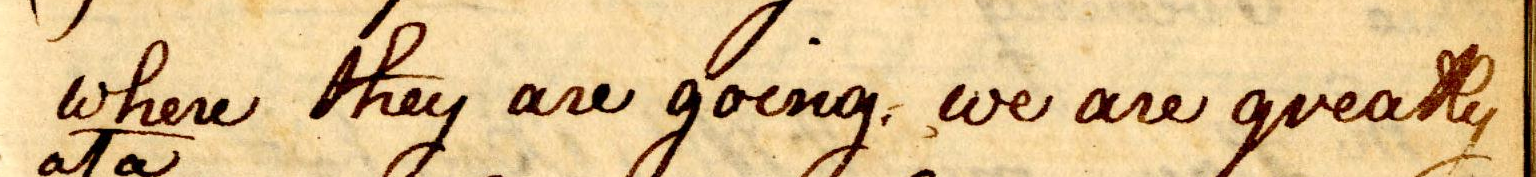where they are going. we are greatly
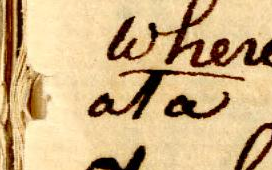at a
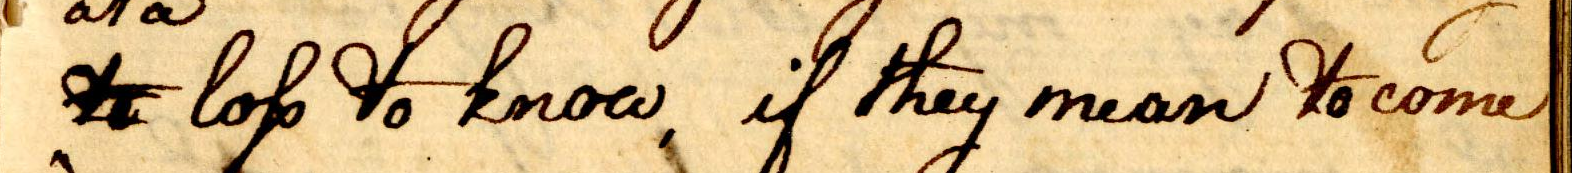^ [to] loss to know, if they mean to come
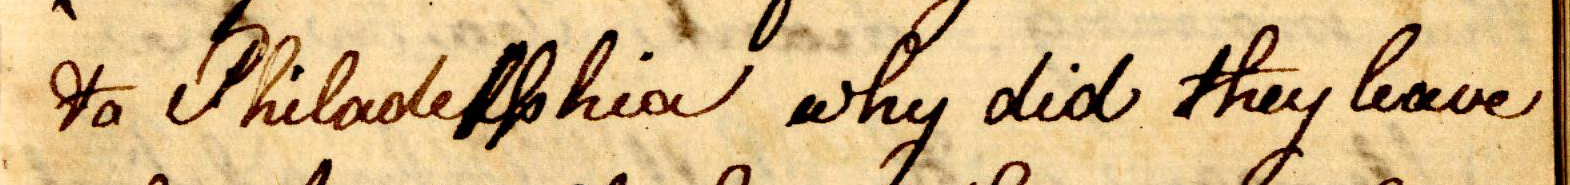to Philadelphia why did they leave
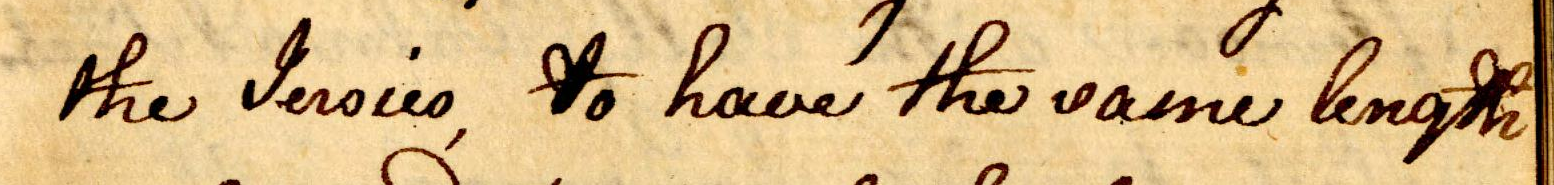the Jersies, to have the same length
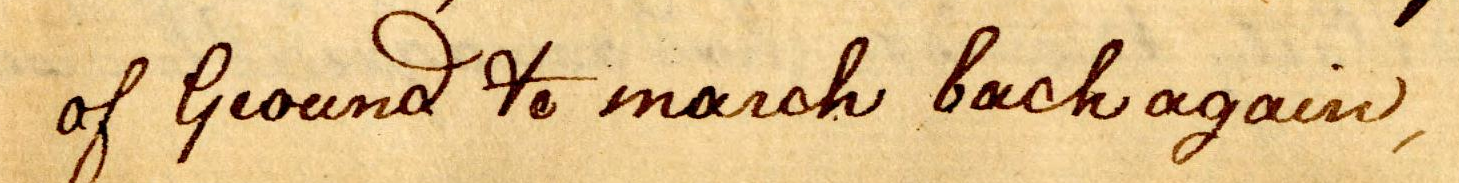of Ground to march back again,
